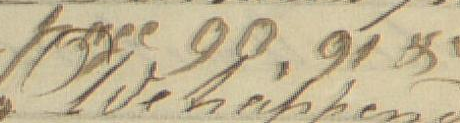page 90, 91 &c
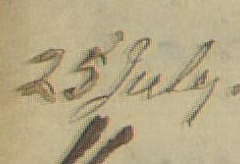25 July
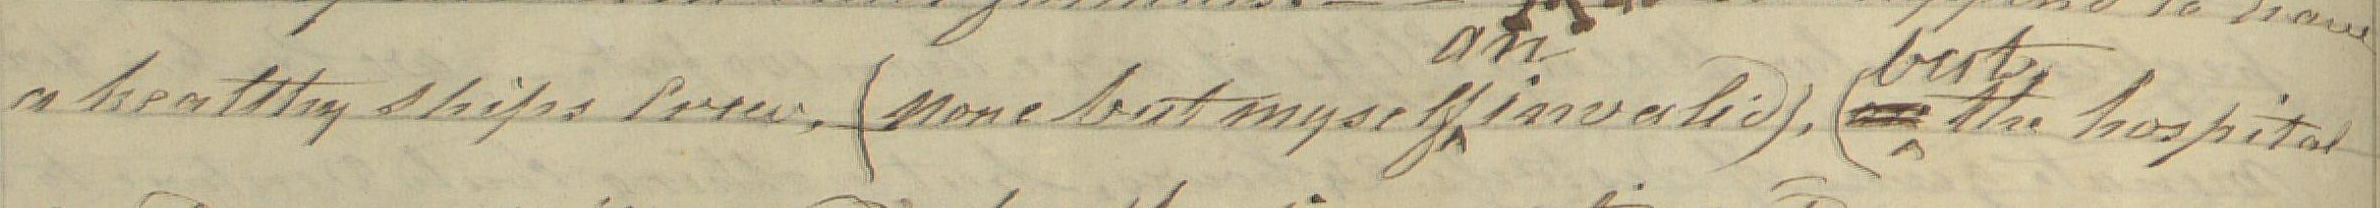a healthy Ships Crew. (None but myself ^ invalid, (or ^ the hospital
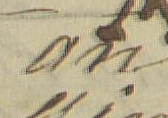an
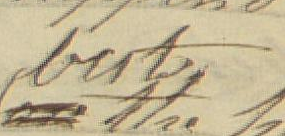but
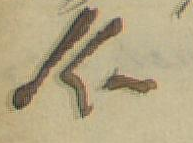K-
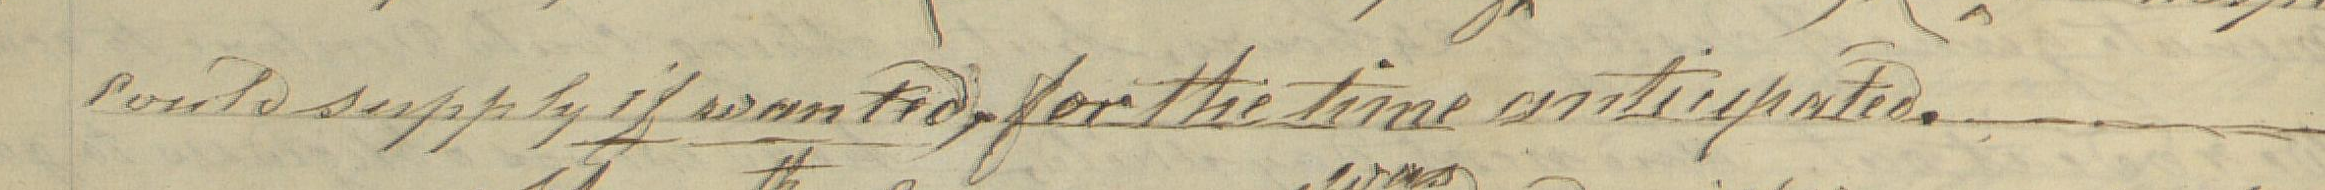could supply if wanted, for the time anticipated.
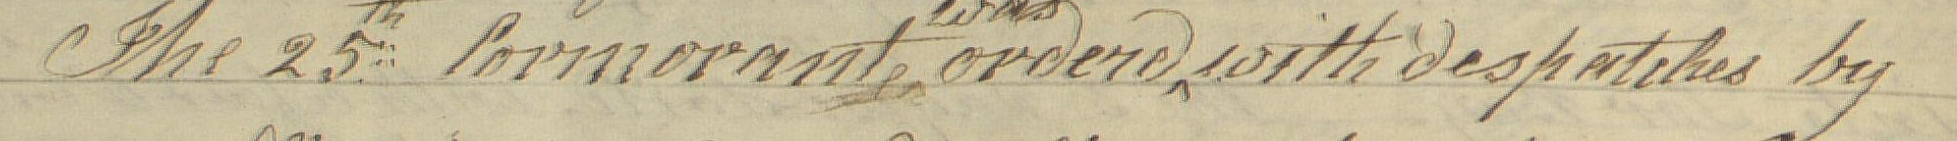The 25^th. Cormorant ^ orderd ^ with despatches by
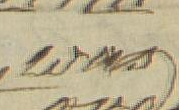was
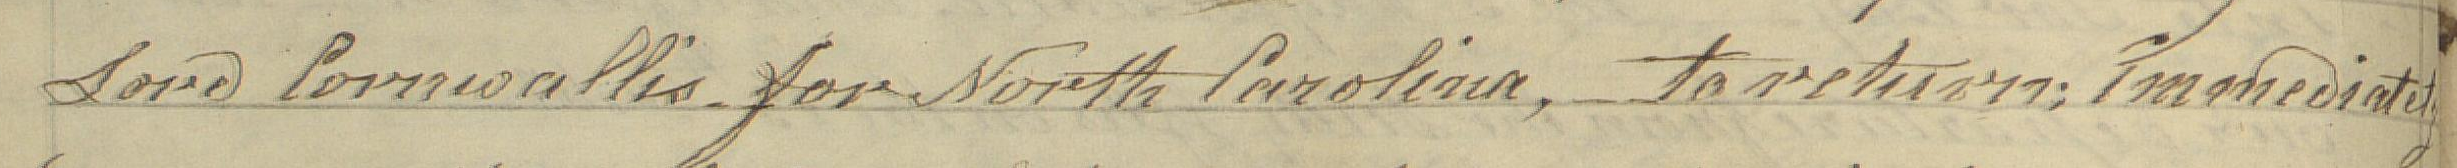Lord Cornwallis for North Carolina, to return immediately
